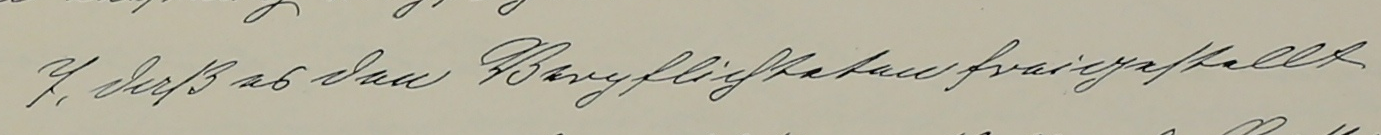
7. daß es den Verpflichteten freigestellt
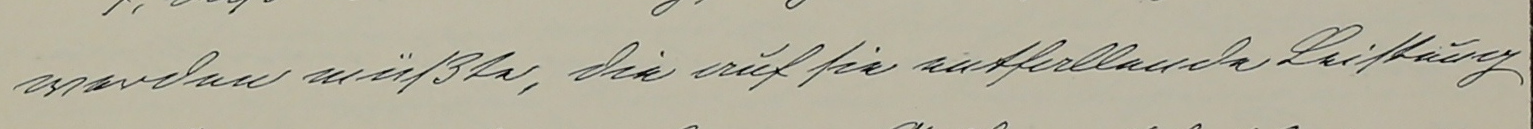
werden müßte, die auf sie entfallende Leistung
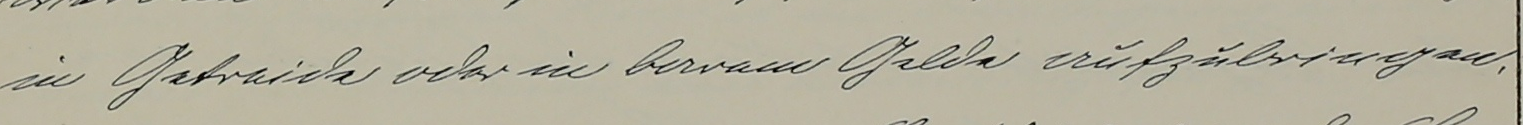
in Getreide oder in barem Gelde aufzubringen.
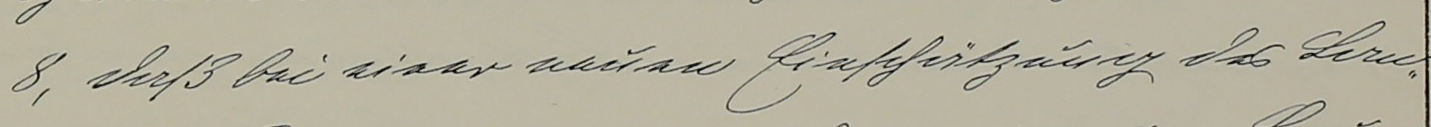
8. daß bei einer neuen Einschätzung des Lan-
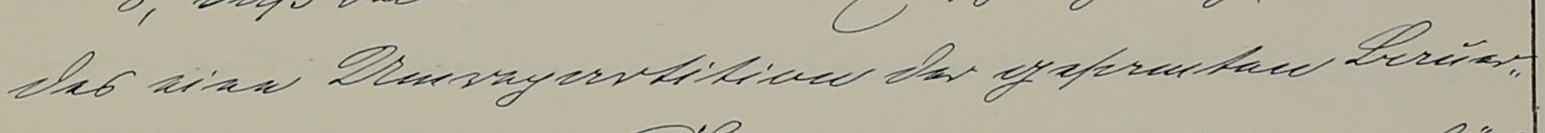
des eine Umrepartition der gesamten Bauer-
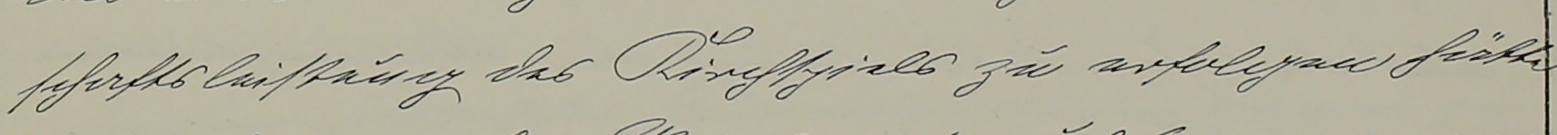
schaftsleistung des Kirchspiels zu erfolgen hätte
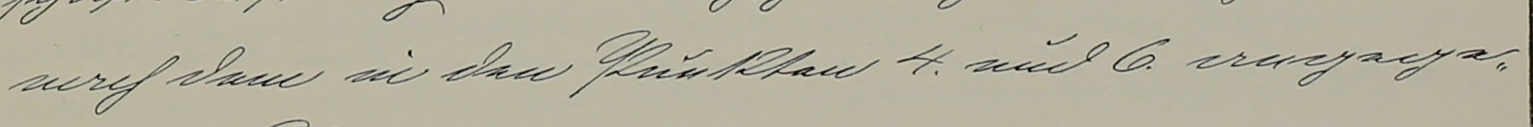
nach dem in den Punkten 4. und 6. angege-
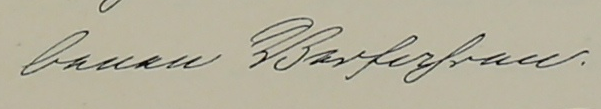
benen Verfahren.
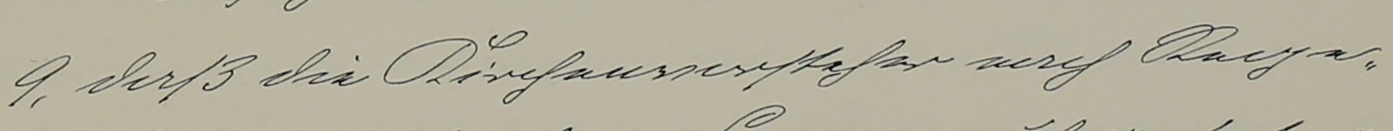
9. daß die Kirchenvorsteher nach Rege-
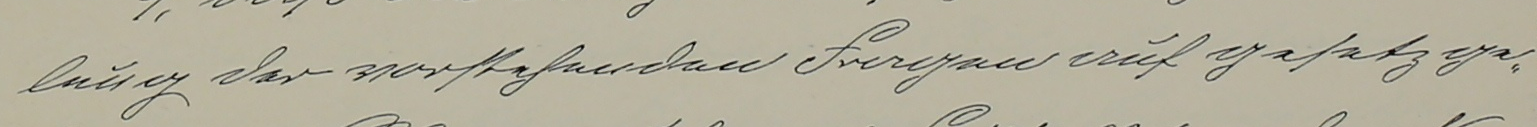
lung der vorstehenden Fragen auf gesetzge-
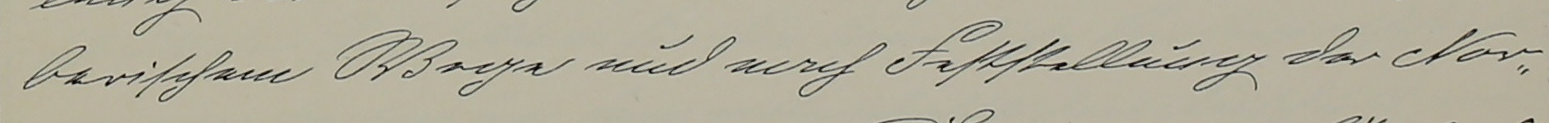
berischem Wege und nach Feststellung der Nor-
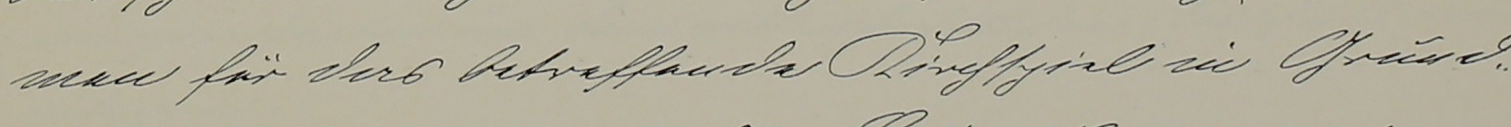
men für das betreffende Kirchspiel in Grund-
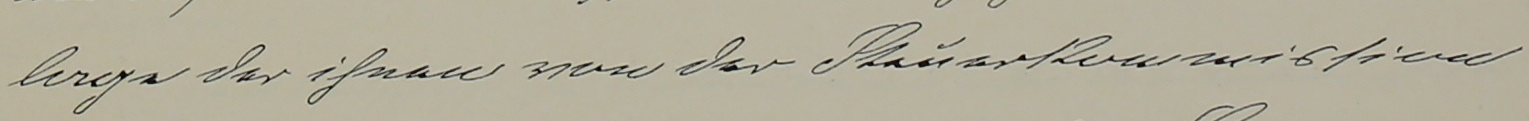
lage der ihnen von der Steuerkommission
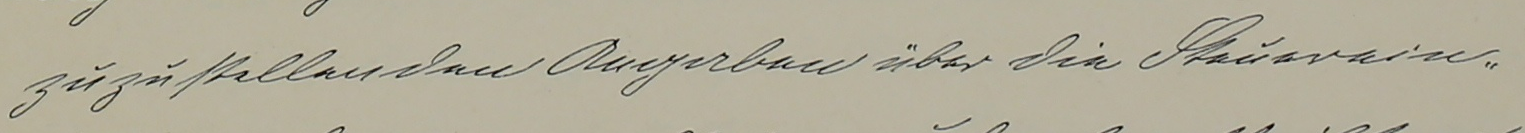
zuzustellenden Angaben über die Steuerein-
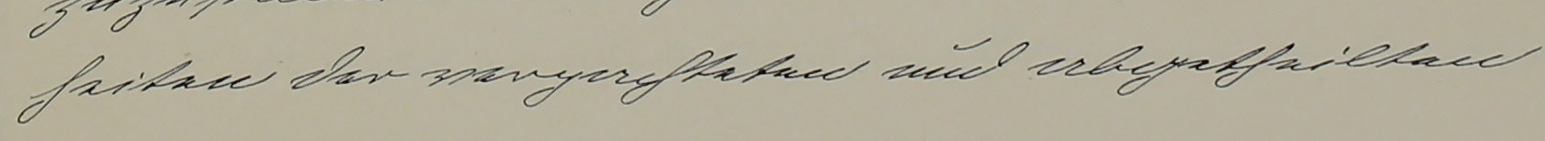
heiten der verpachteten und abgetheilten
